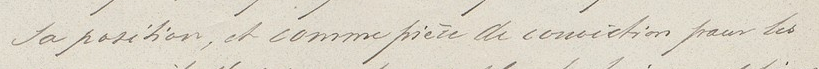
sa position, et comme pièce de conviction pour les
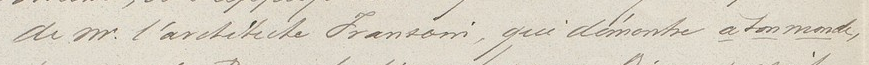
de Mr l'architecte Franzoni, qui démontre asonmonde,
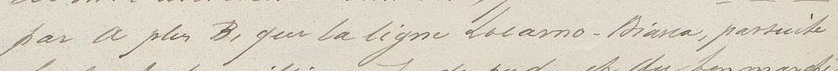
par A plus B, que la ligne Locarno–Biasca, parsuite
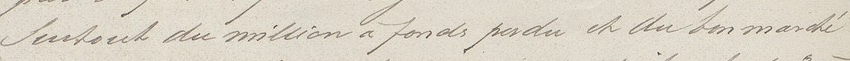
surtout du million à fonds perdu et du bon marché
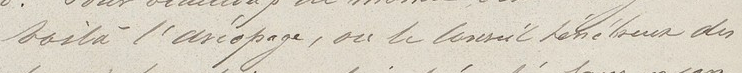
Voilà l'Aréopage, ou le Conseil ténébreux des
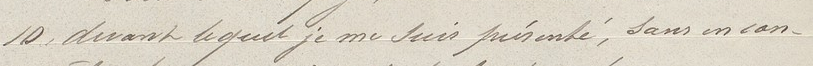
10, devant lequel je me suis présenté, sans en con-
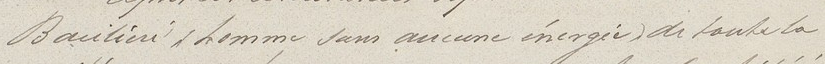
Bacilieri, (homme sans aucune énergie) de toute la
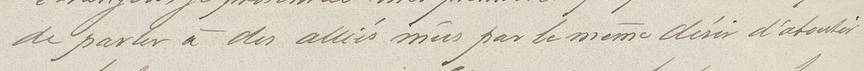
de parler à des alliés mûs par le même désir d'aboutir
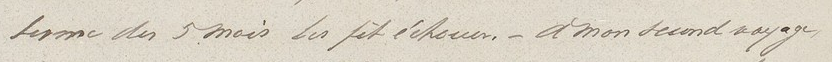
terme des 5 mois les fit échouer. – À mon second voyage
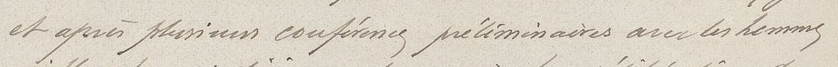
et après plusieurs conférences préliminaires avec ces hommes
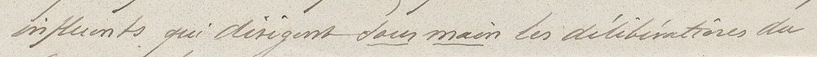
influents qui dirigent sousmain les délibérations du
